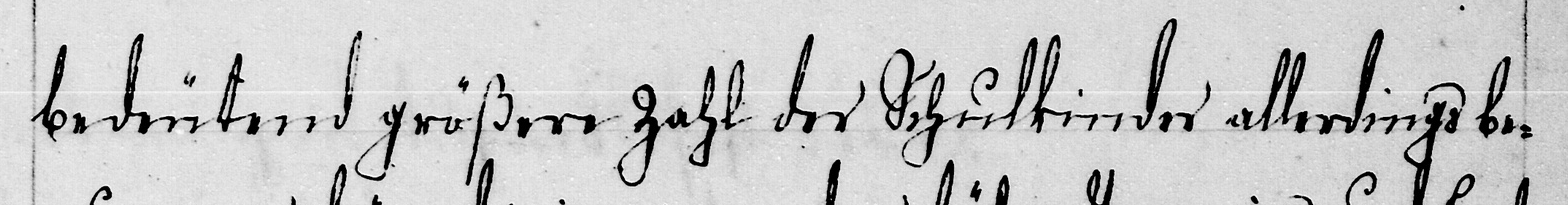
bedeutend größere Zahl der Schulkinder allerdings be¬
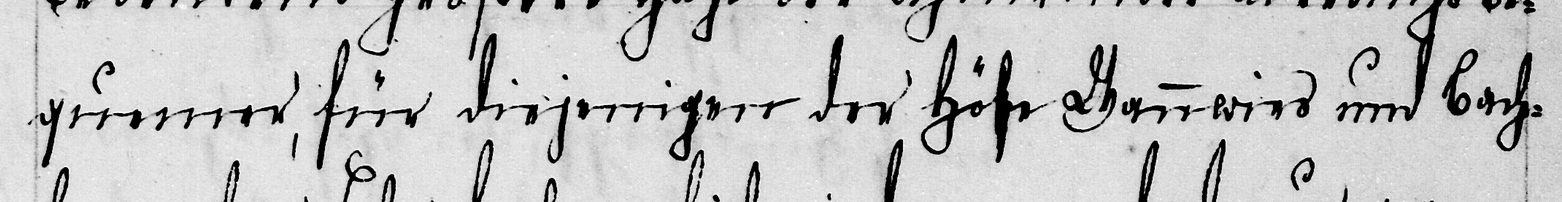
quemer, für diejenigen der Höfe Wannwies und Bach¬
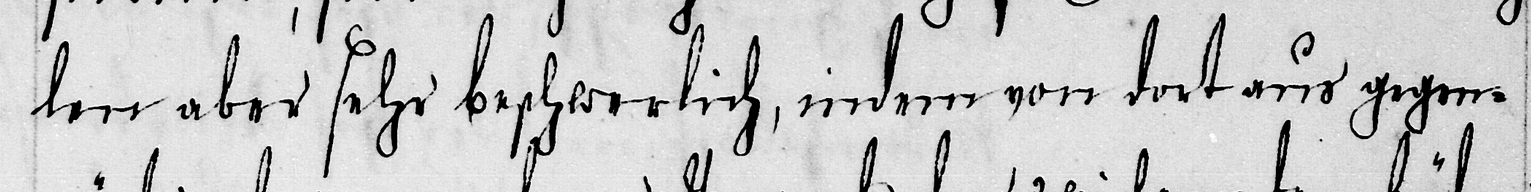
len aber sehr beschwerlich, indem von dort aus gegen¬
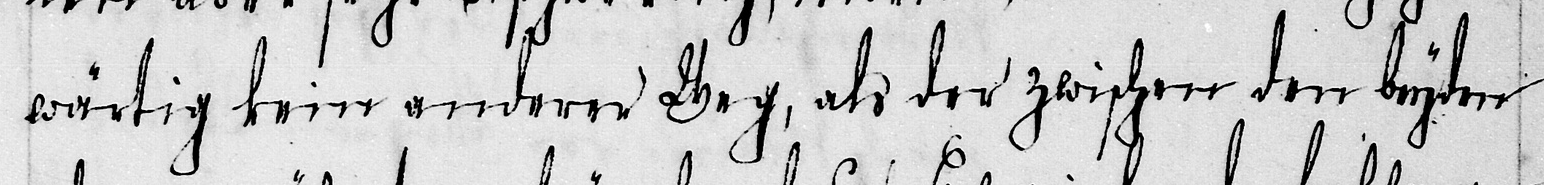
wärtig kein anderer Weg, als der zwischen den beyden
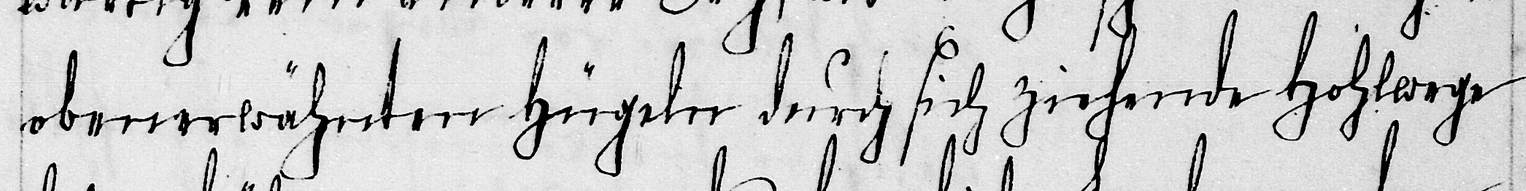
obenerwähnten Hügeln durch sich ziehende Hohlwege
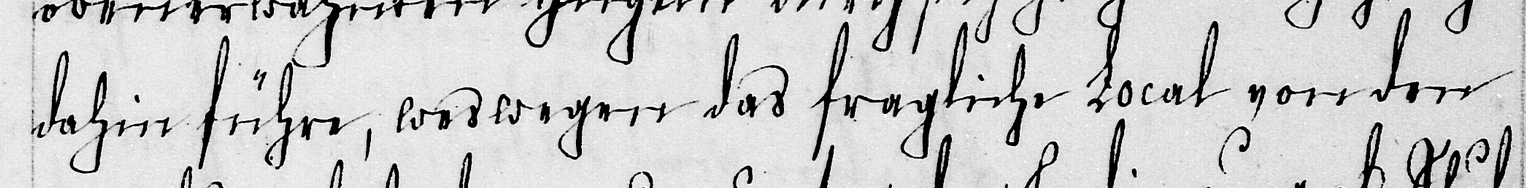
dahin führe, weswegen das fragliche Local von den
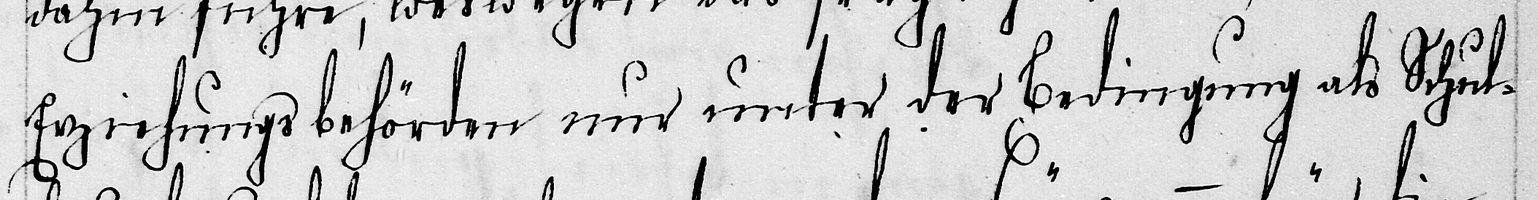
Erziehungsbehörden nur unter der Bedingung als Schul¬
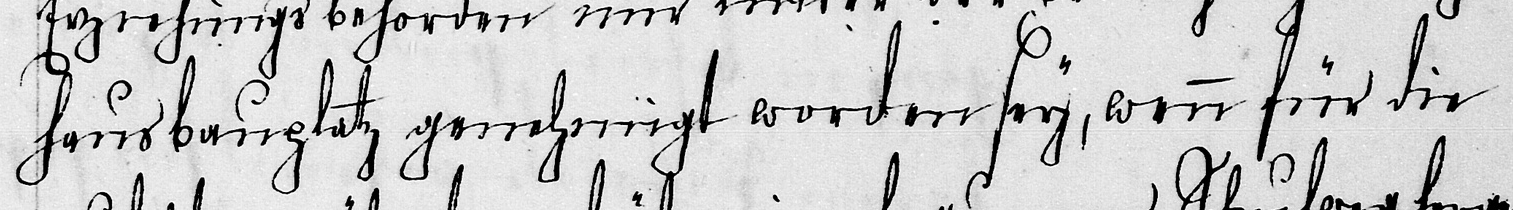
hausbauplatz genehmigt worden sey, wenn für die
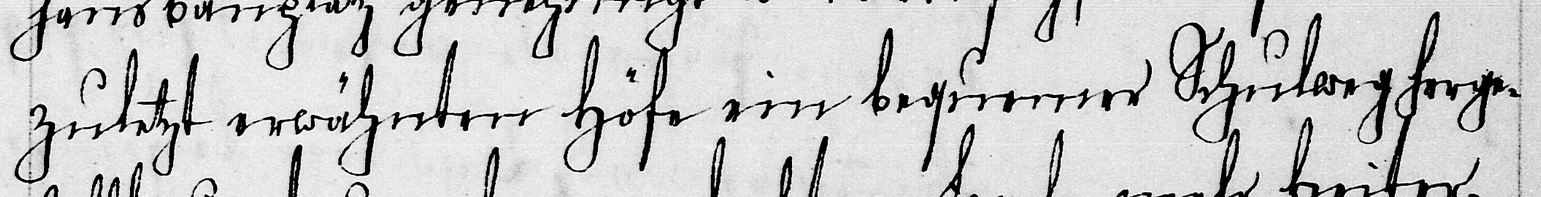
zuletzt erwähnten Höfe ein bequemer Schulweg herge¬
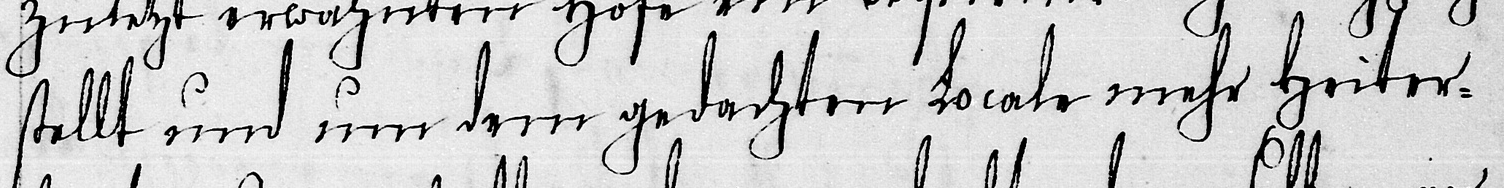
stellt und um dem gedachten Locale mehr Heiter¬
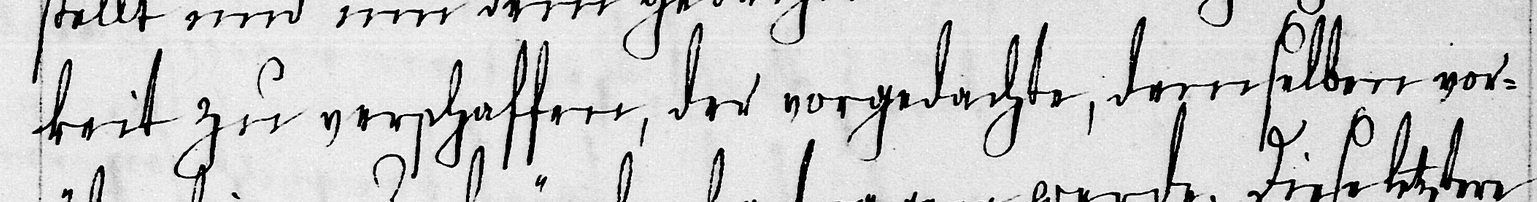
keit zu verschaffen, der vorgedachte, demselben vor¬
